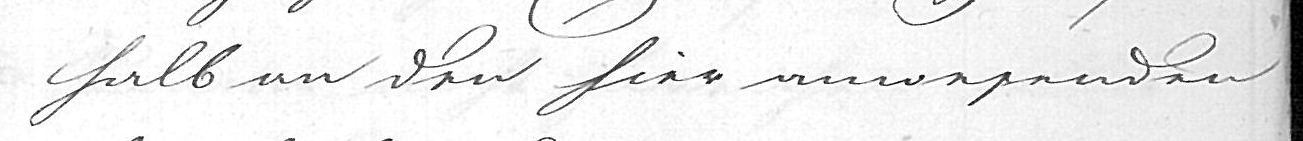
halbe an den hier anwesenden
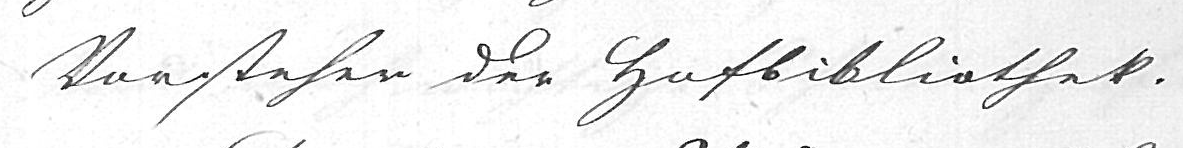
Vorsteher der Hofbibliothek.
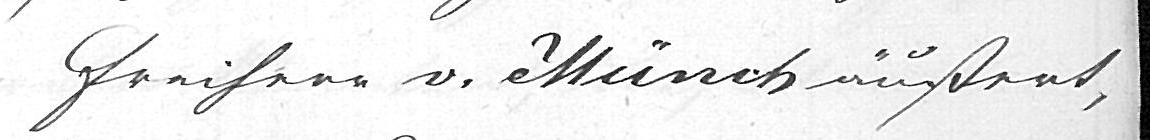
Freiherr v. Münch äußert,
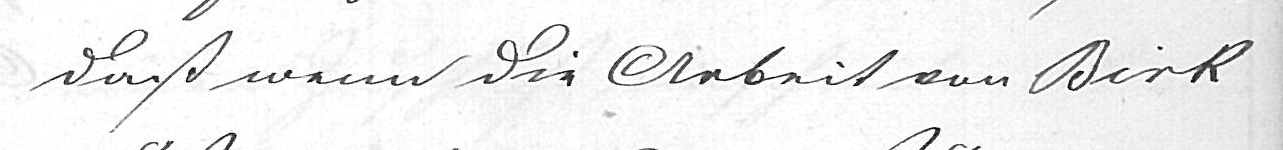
daß wenn die Arbeit von Birk
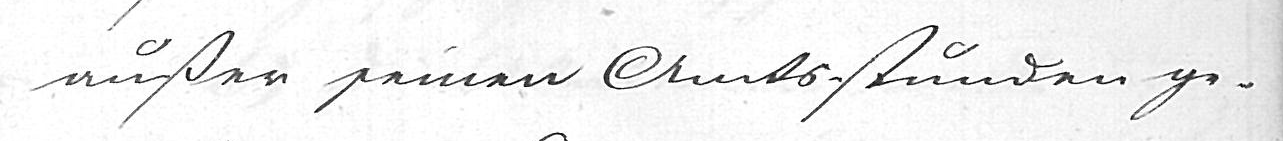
außer seinen Amtsstunden ge-
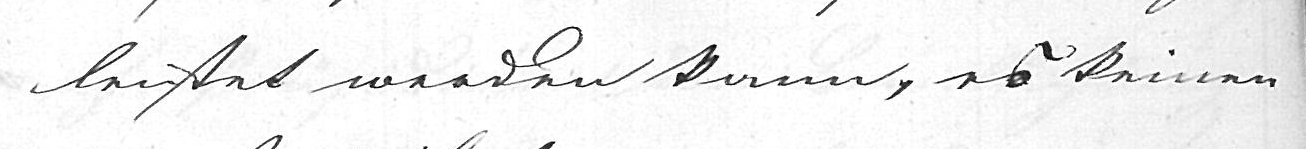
leistet werden kann; es keinen
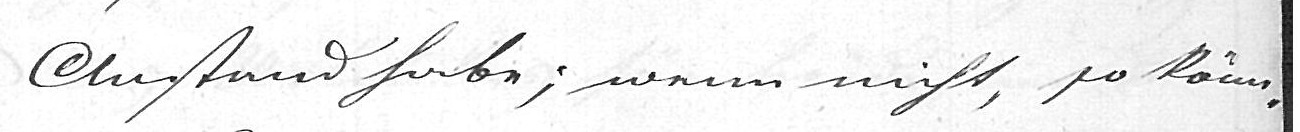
Anstand habe; wenn nicht, so könn-
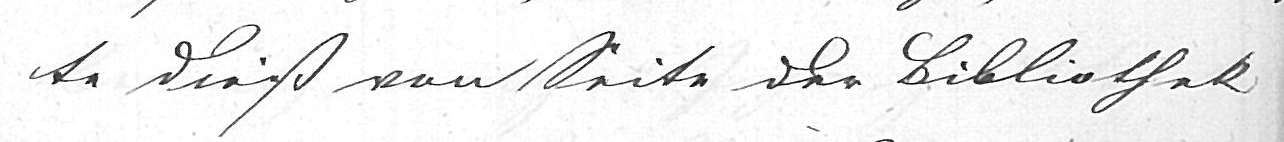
te dieß von Seite der Bibliothek
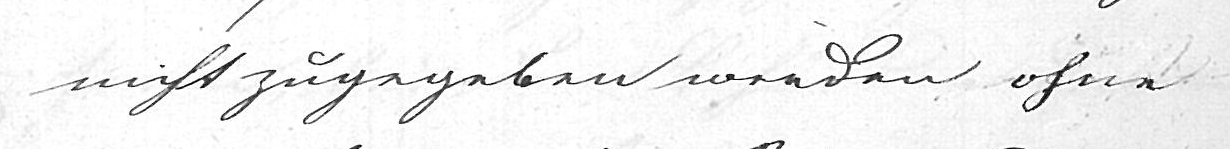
nicht zugegeben werden ohne
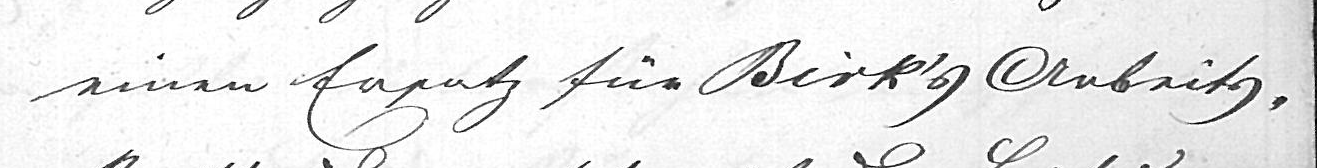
einen Ersatz für Birk's Arbeits-
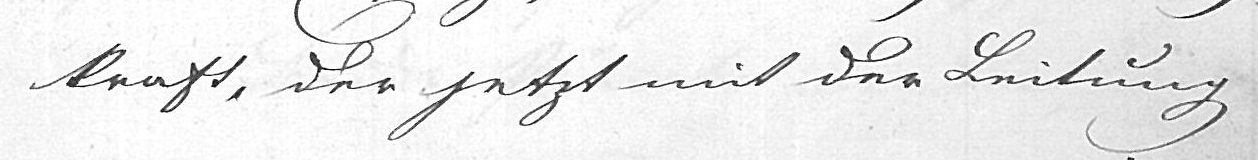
kraft, der jetzt mit der Leitung
